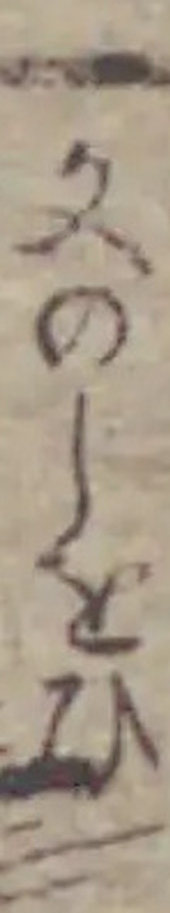文のしをひ
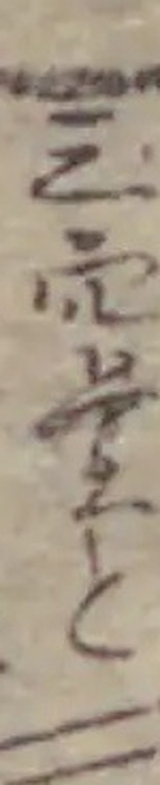三穴堂と
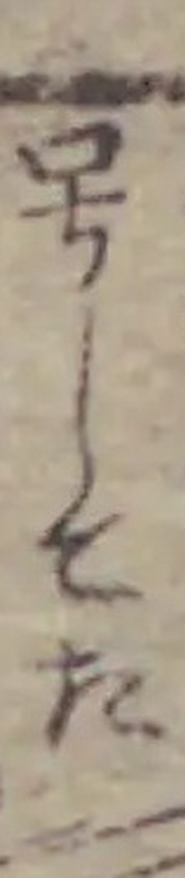号してた
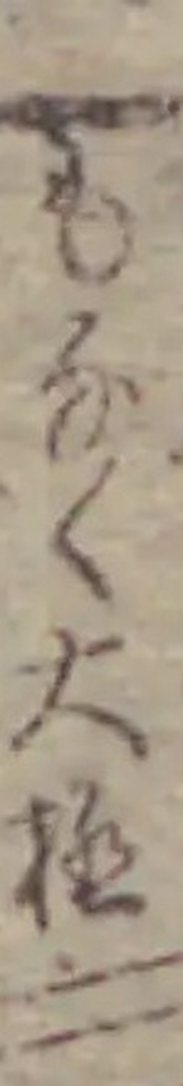もなく大極
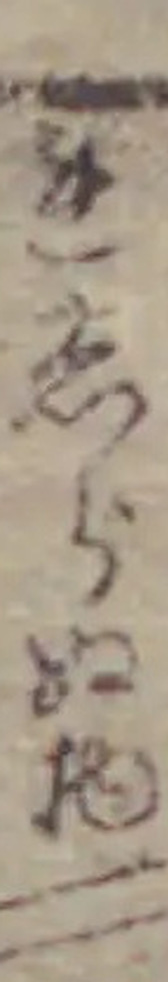れしらぬ物
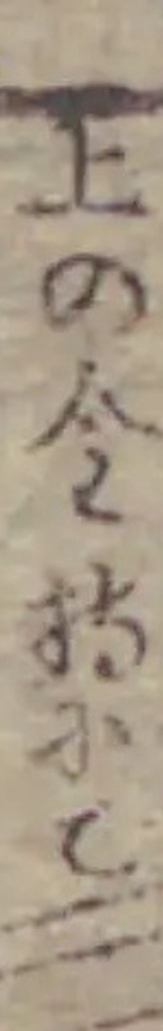上の金持にて
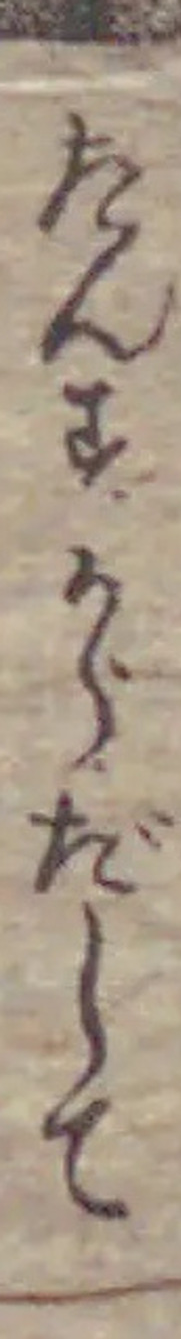たんすからだして
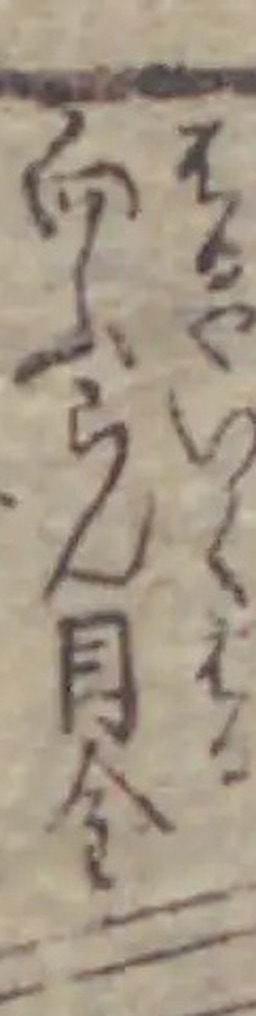向ふらん目金
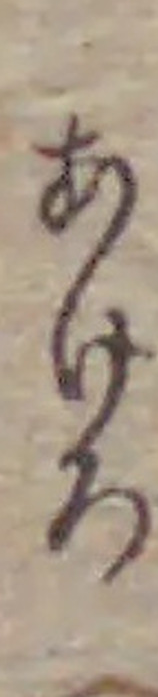あけろ
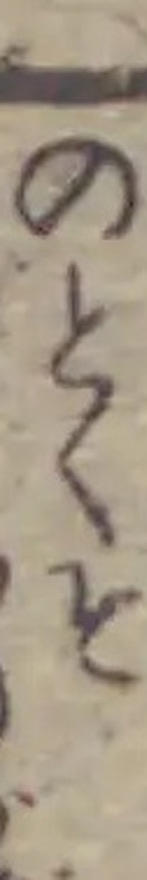のとくぞ
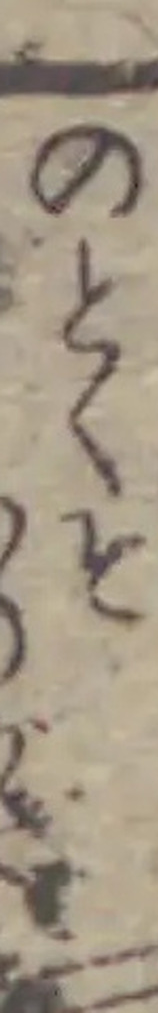のとくぞ
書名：栄増眼鏡徳 3巻
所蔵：国立国会図書館 National Diet Library, JAPAN
